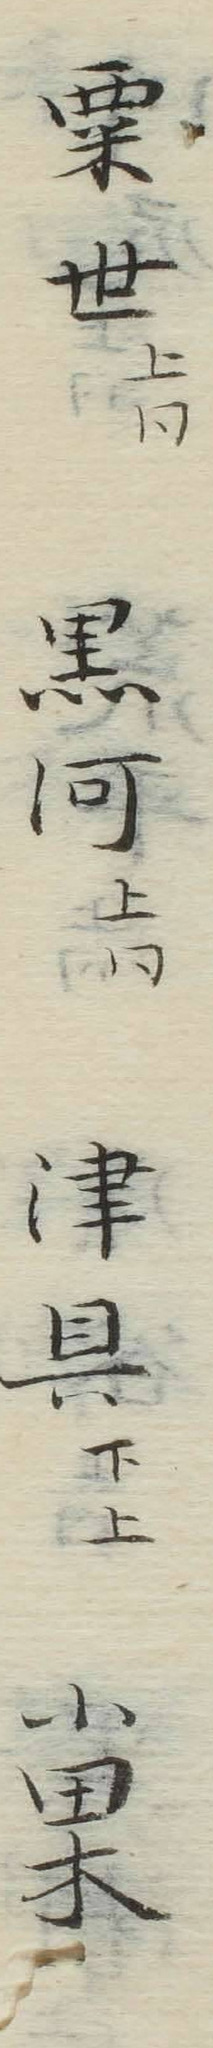粟世上同黒河上同津具下上小田木
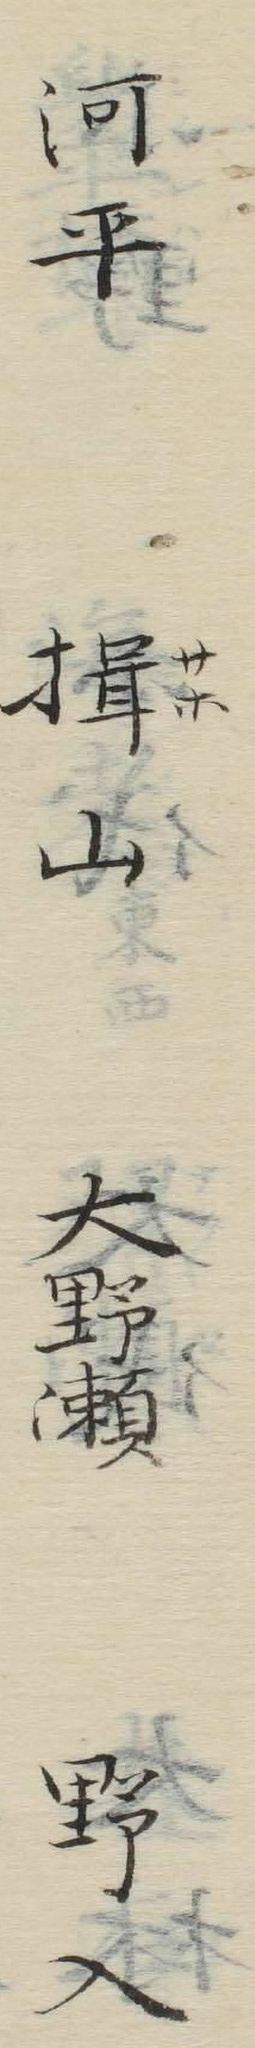河平揖山大野瀬野入
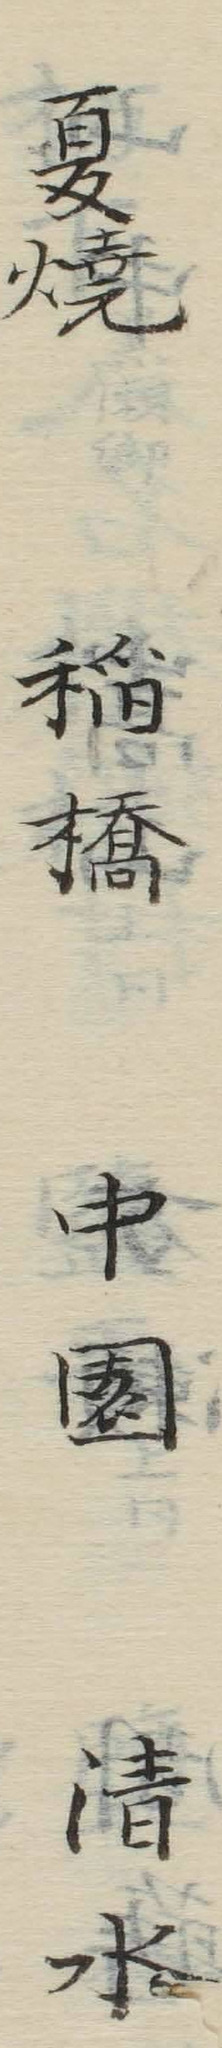夏焼稲橋中園清水
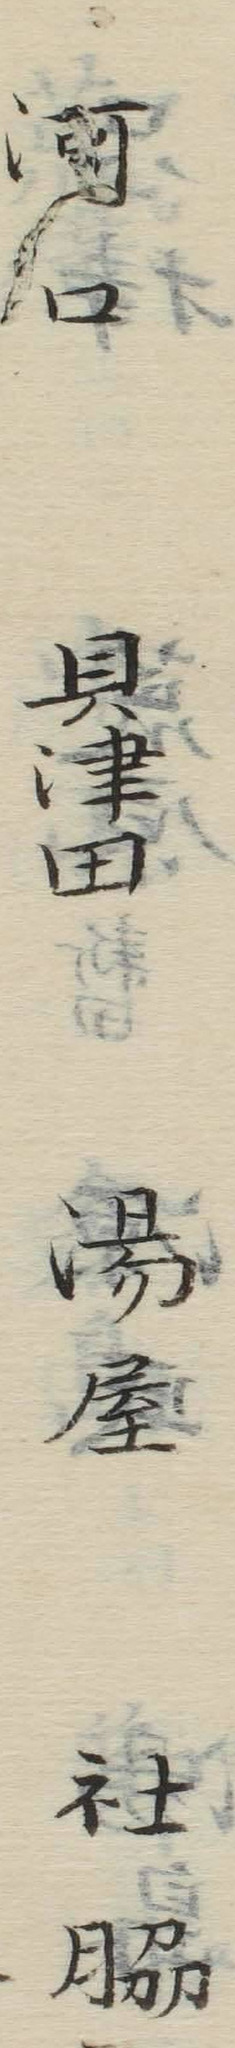河口貝津田湯屋社脇
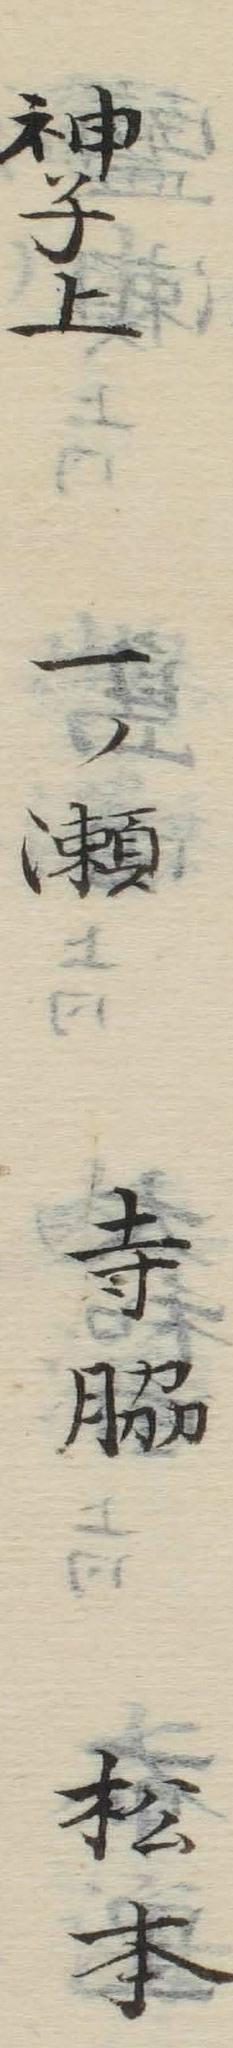神子上一ノ瀬寺脇松本
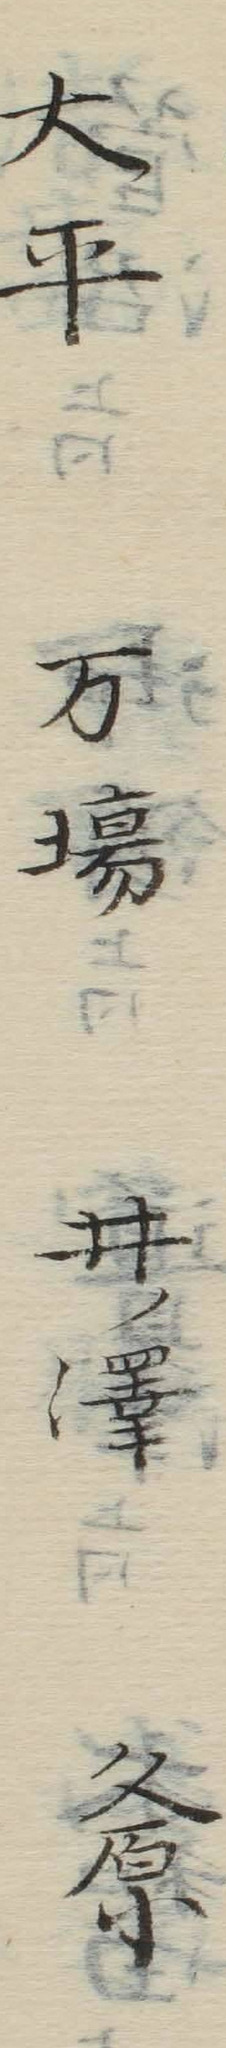大平万場井ノ澤久原
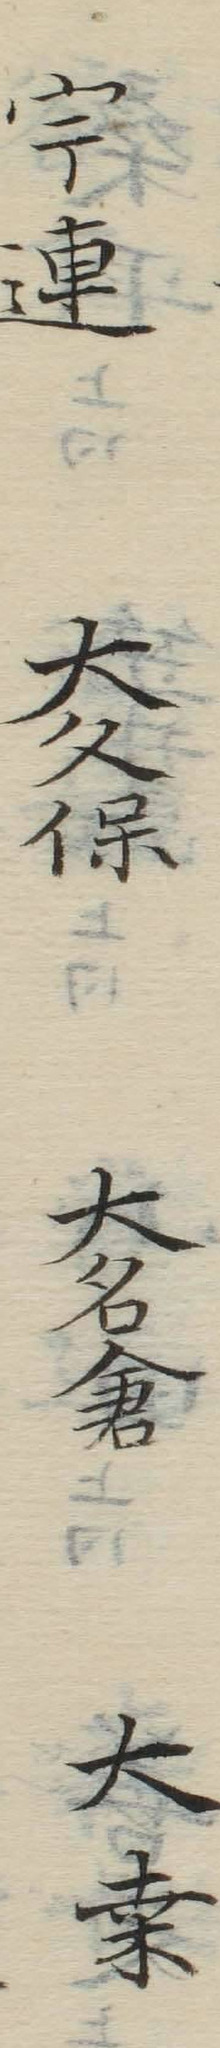宇連大久保大名倉大桑
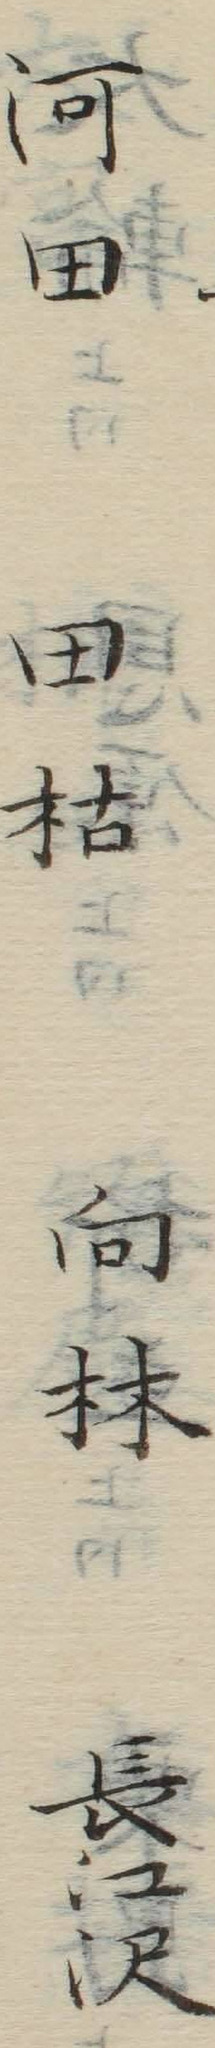河田田枯向林長江沢

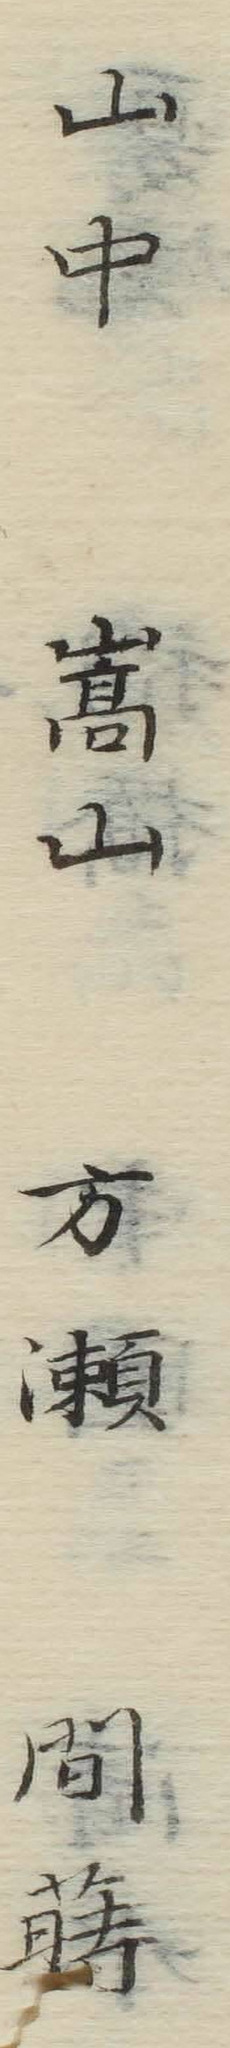山中嵩山方瀬間蒔
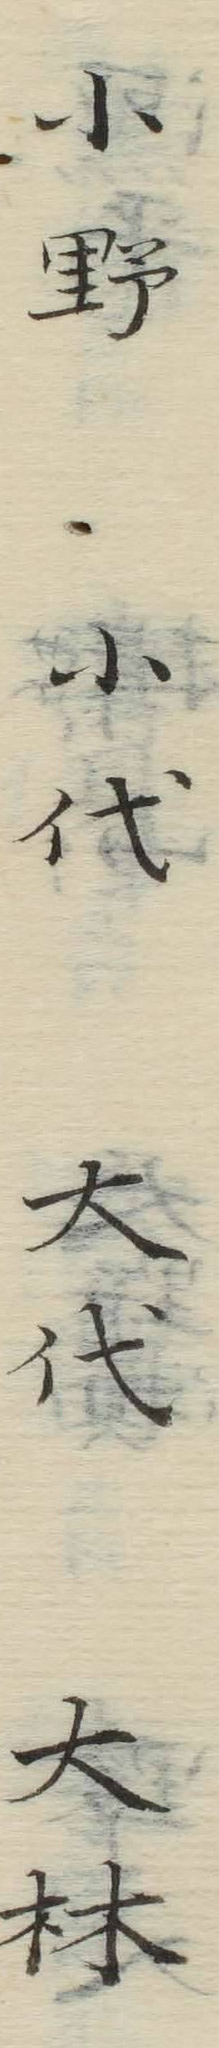小野小代大代大林
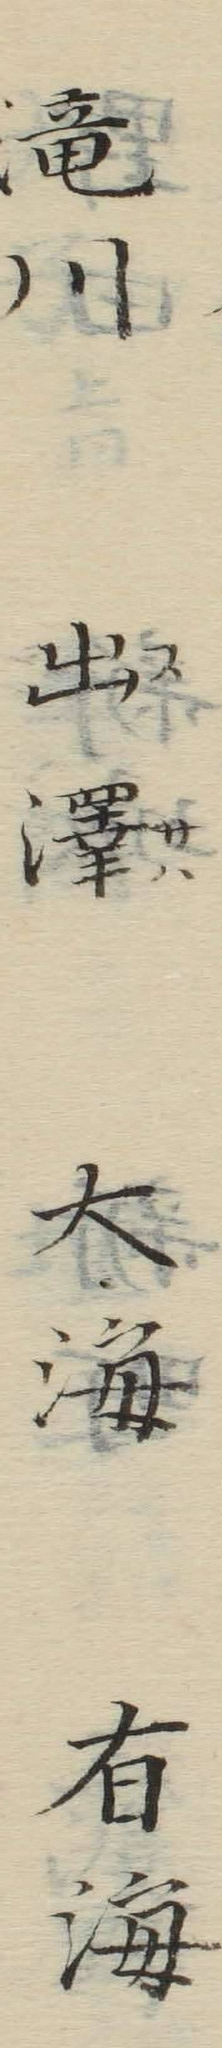滝川出沢大海有海
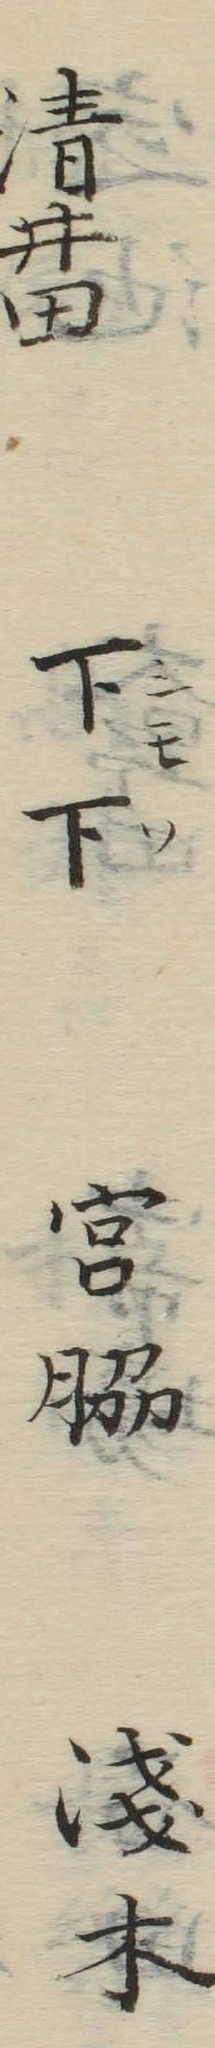清井田下下宮脇浅木
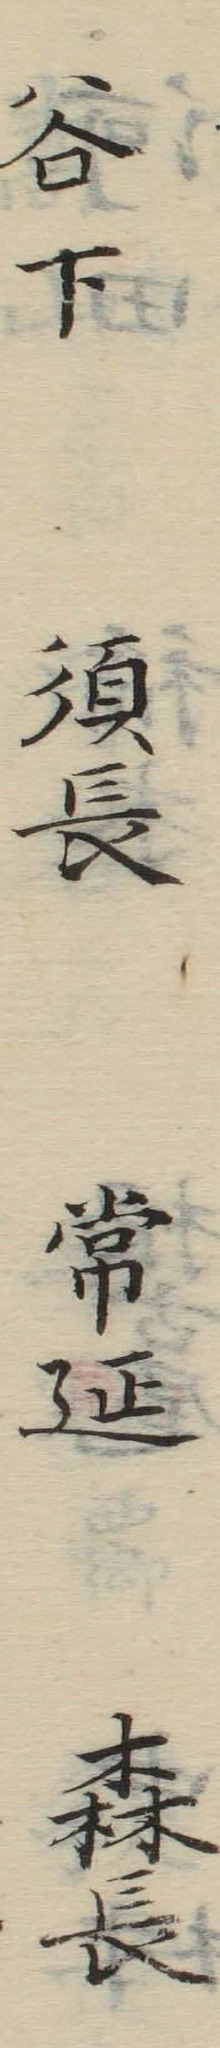谷下須長常延森長
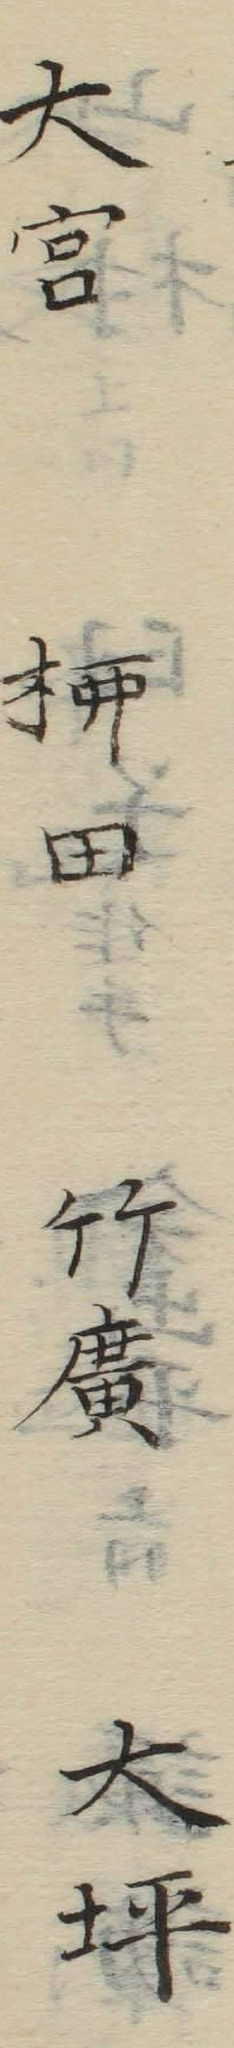大宮柳田竹広大坪

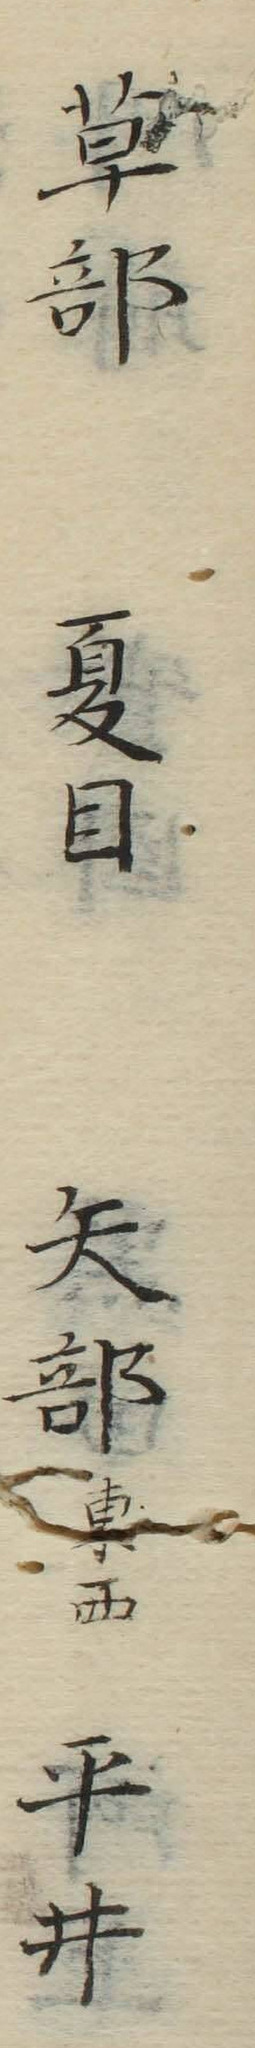草部夏目矢部東西平井
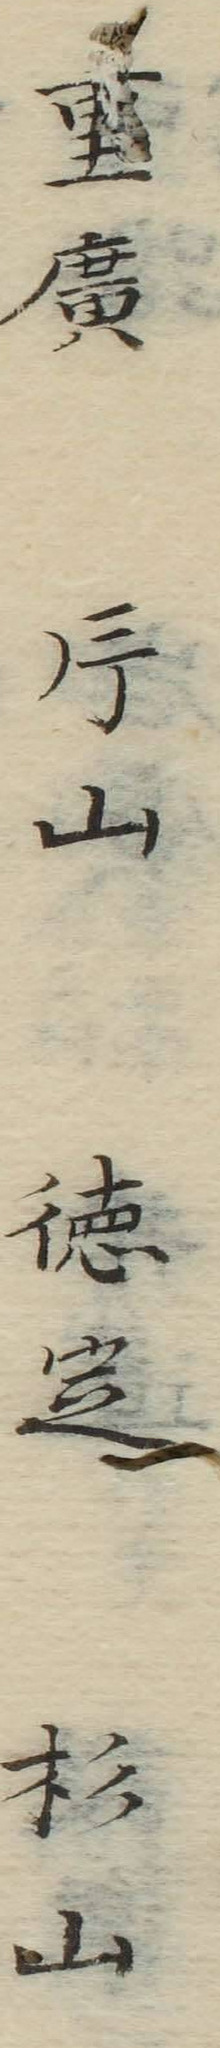重廣片山徳定杉山
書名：三河国二葉松
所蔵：国文学研究資料館
